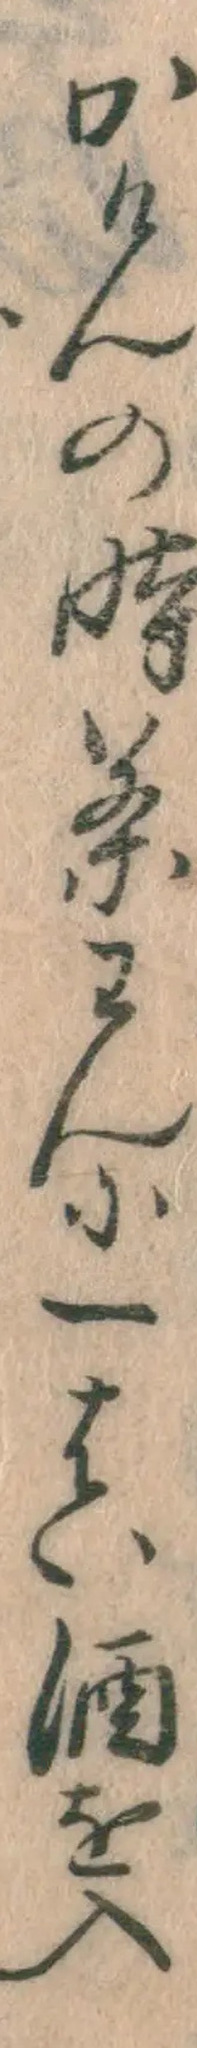かけんの時茶わんに一はい酒を入
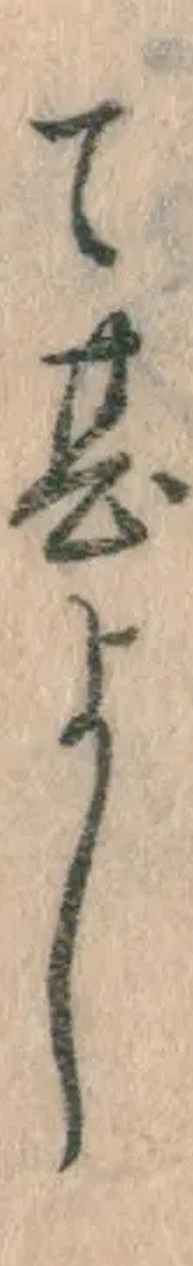て甚よし
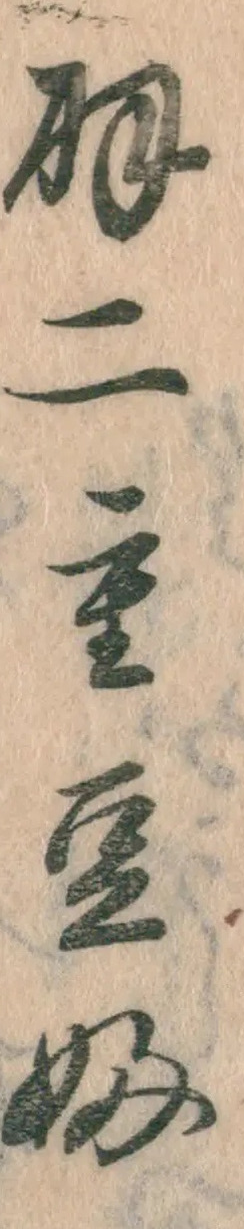羽二重豆ふ
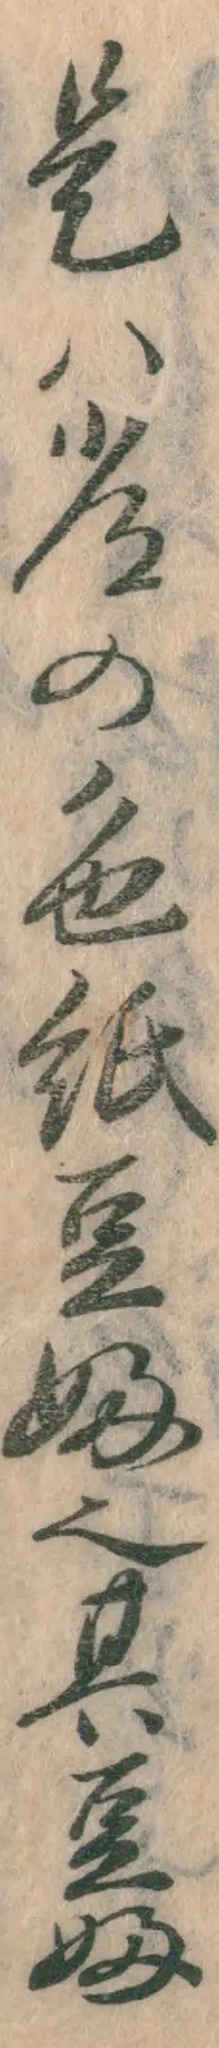是は常の色紙豆ふ也其豆ふ
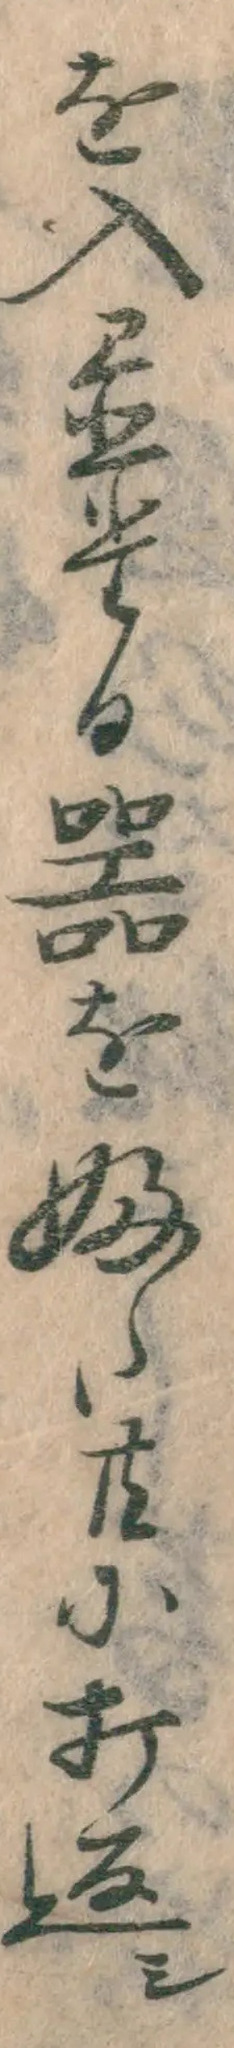を入置たる器をふた共に打返し
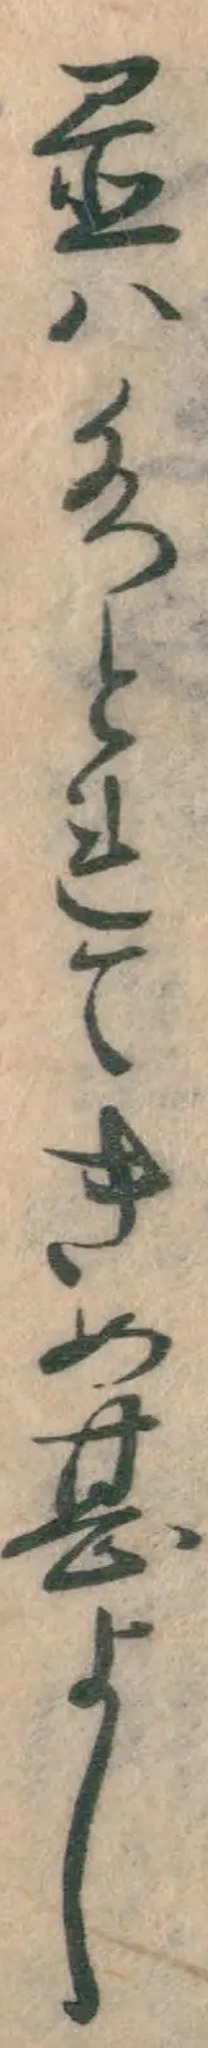置は水とれてきめ甚よし

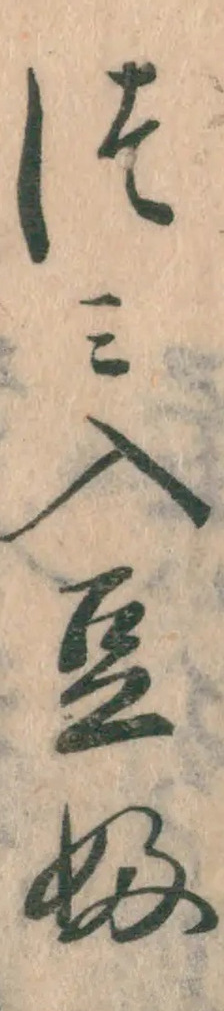つみ入豆ふ
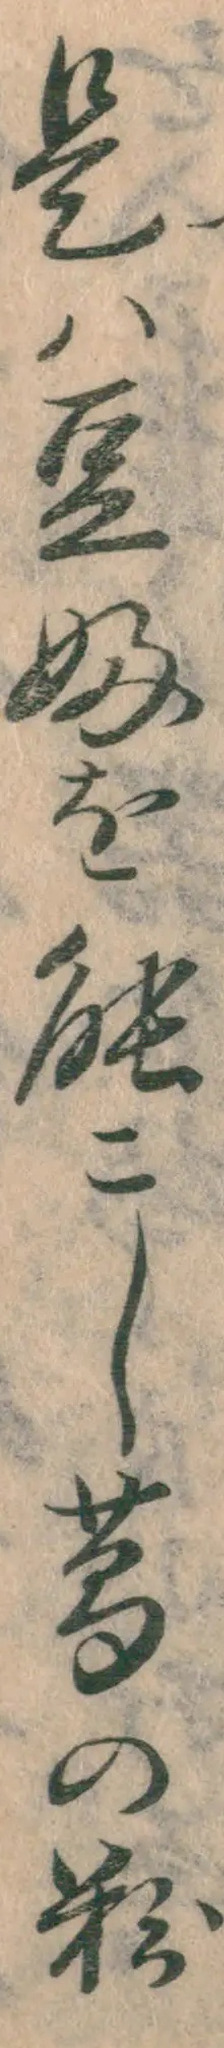是は豆ふを能こし葛の粉
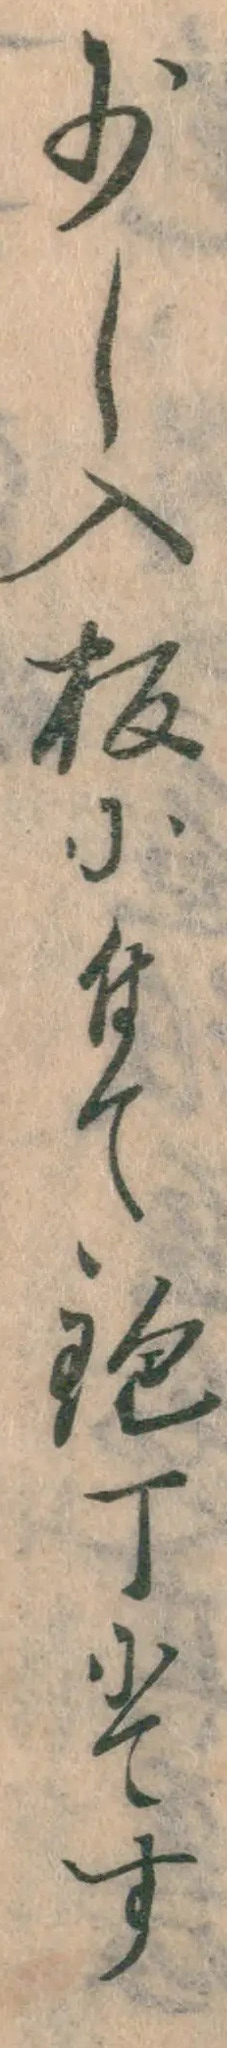少し入板に付て鉋丁にてす
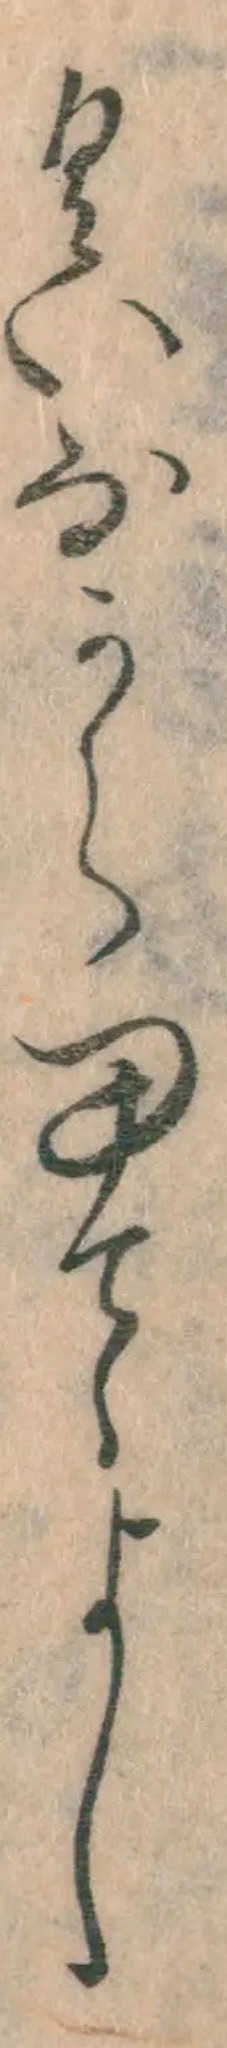くいなからゆてゝよし
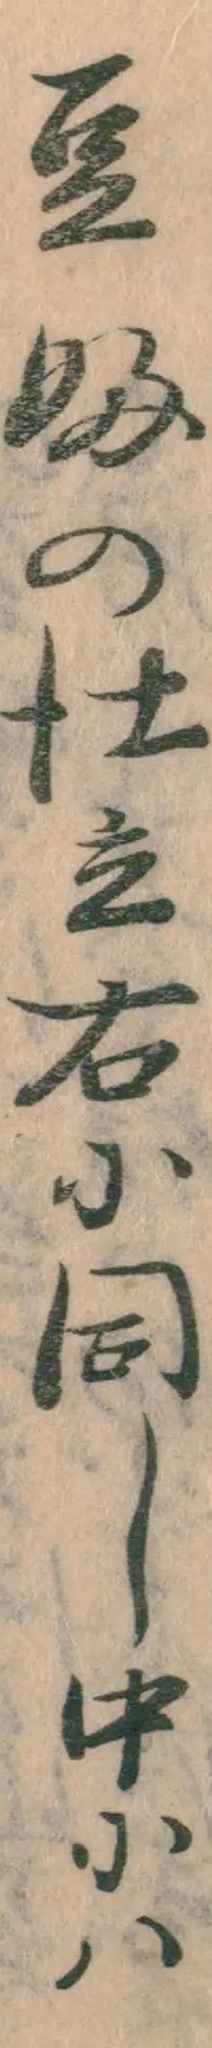豆ふの仕立右に同し中には
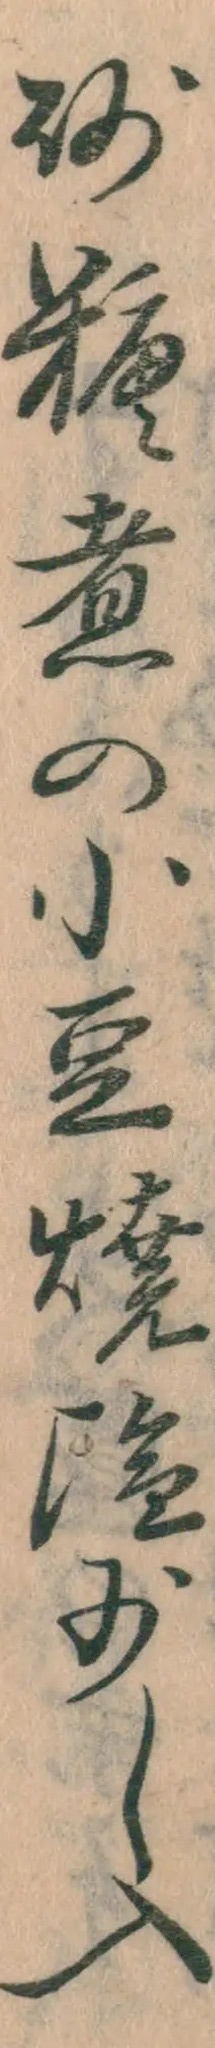砂糖煮の小豆焼塩少し入
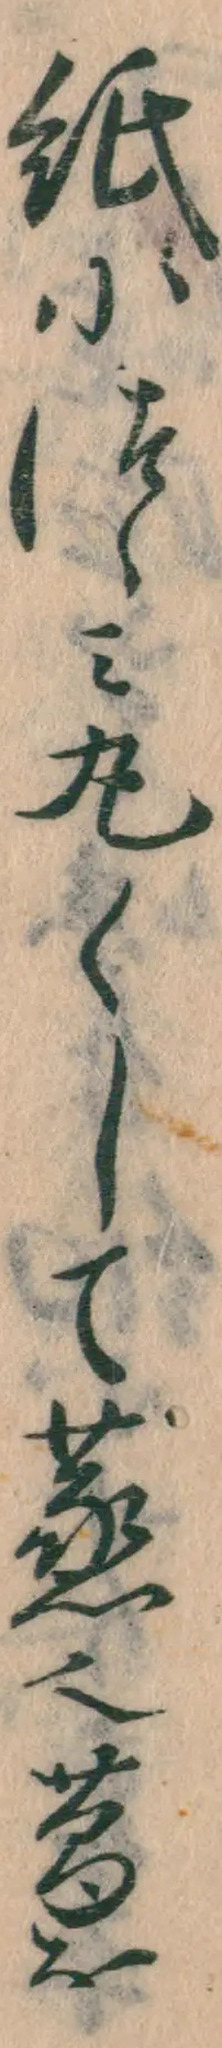紙のつゝみ丸くして蒸也葛を
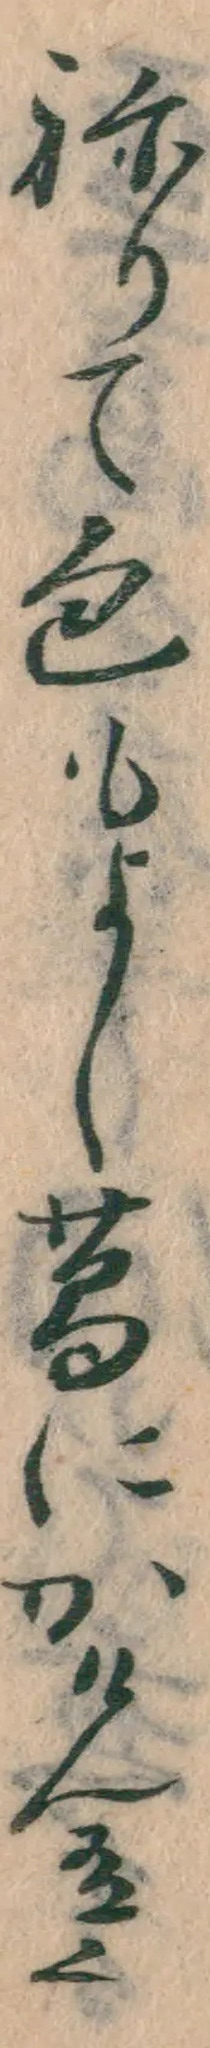ねりて包もよし葛にかけん有也
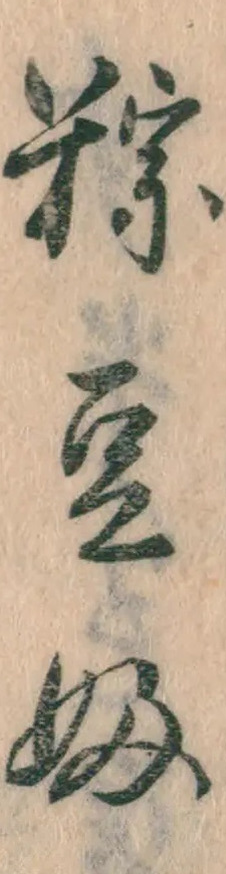粽豆ふ
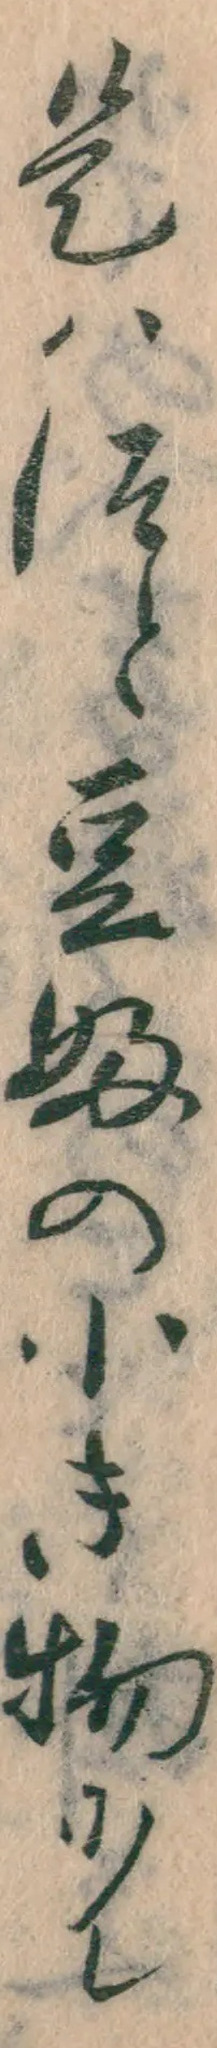是はつと豆ふの小き物にて
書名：豆腐百珍余録
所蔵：国立国会図書館 National Diet Library, JAPAN
